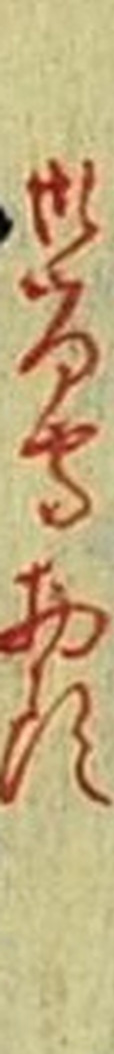御留守物頭
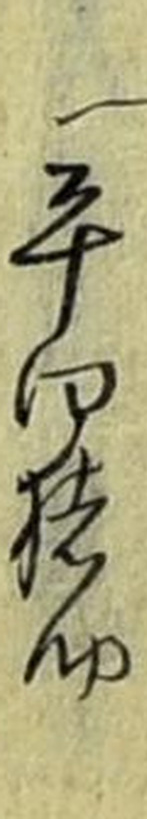平田猪助
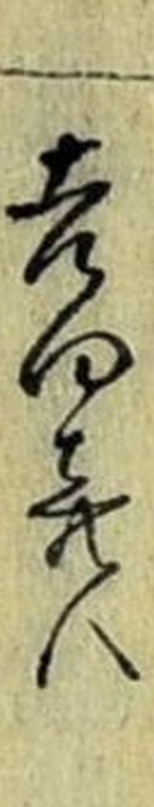吉田喜八
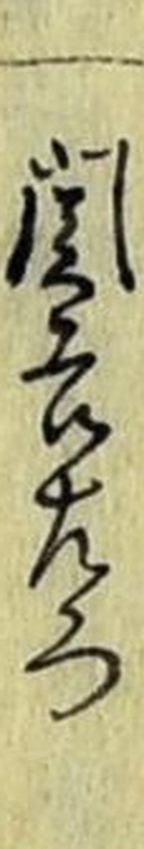関吉左衛門
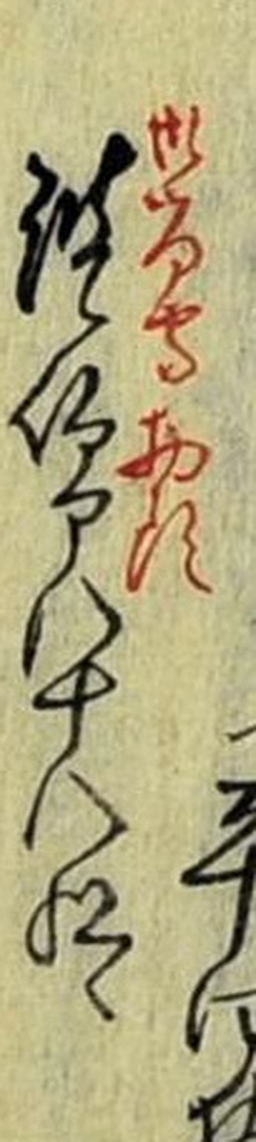波々伯部八十八組へ
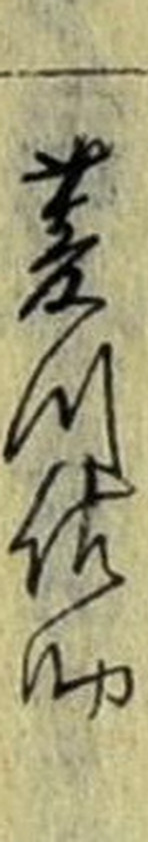管川佐助
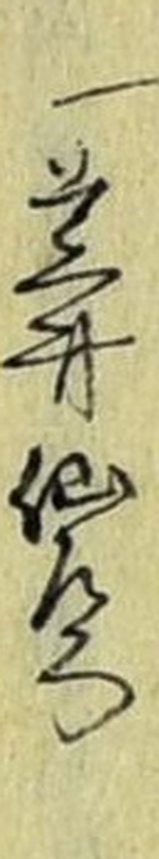笠井仙左衛門
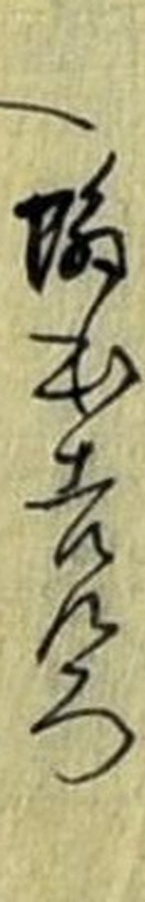蠏本吉左衛門
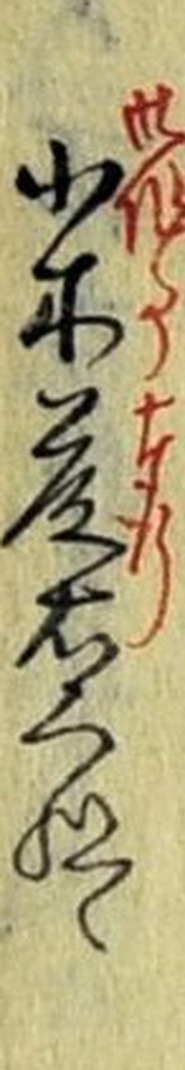小木藤右衛門組へ
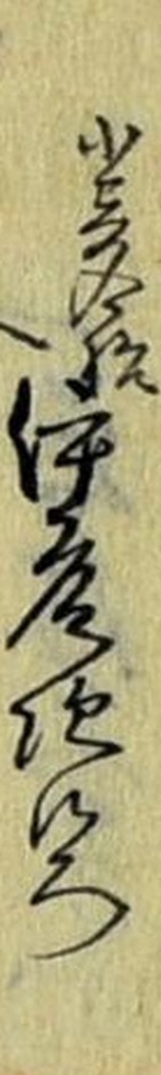小牧由左衛門
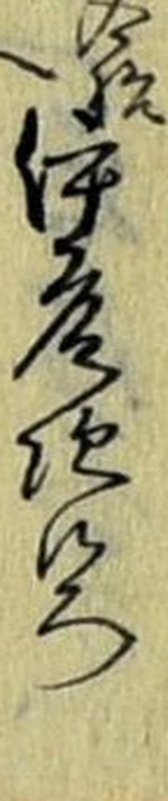佐藤次右衛門

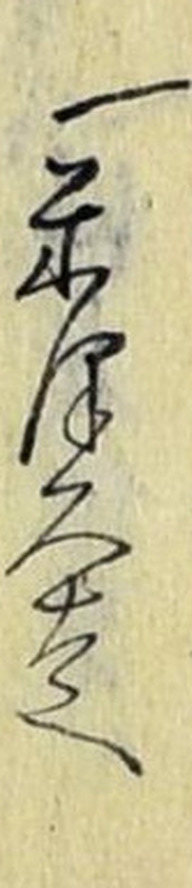米沢久太夫
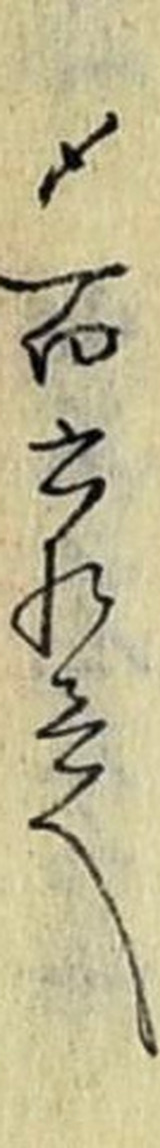〆百六拾壱人
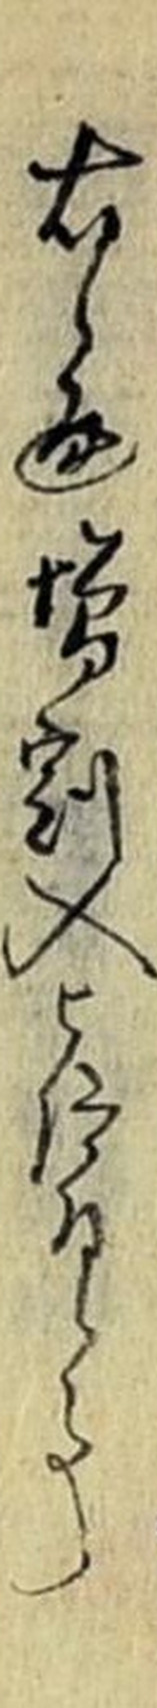右之通増割入被仰付候事
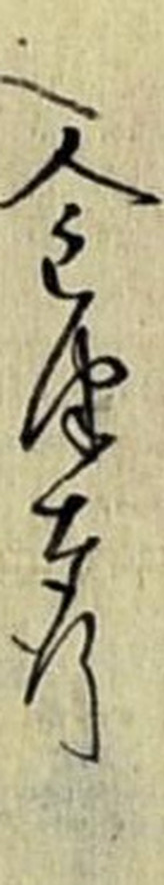金津奉行
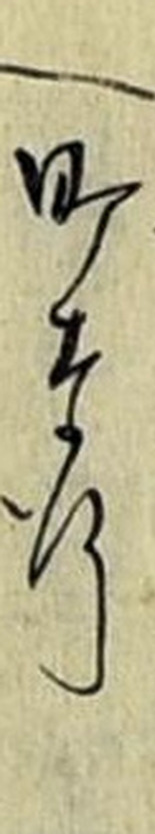町奉行
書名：命令之部 四
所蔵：福井県文書館 Fukui Prefectural Archives
